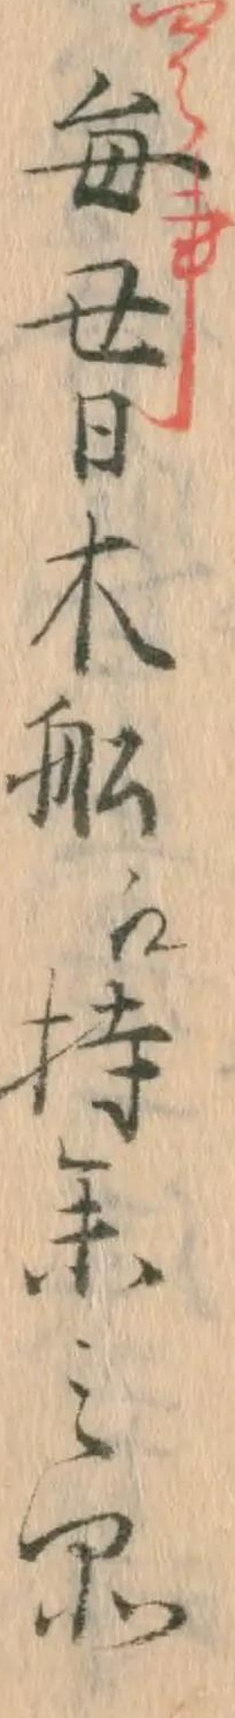毎丑日木船え持参之品
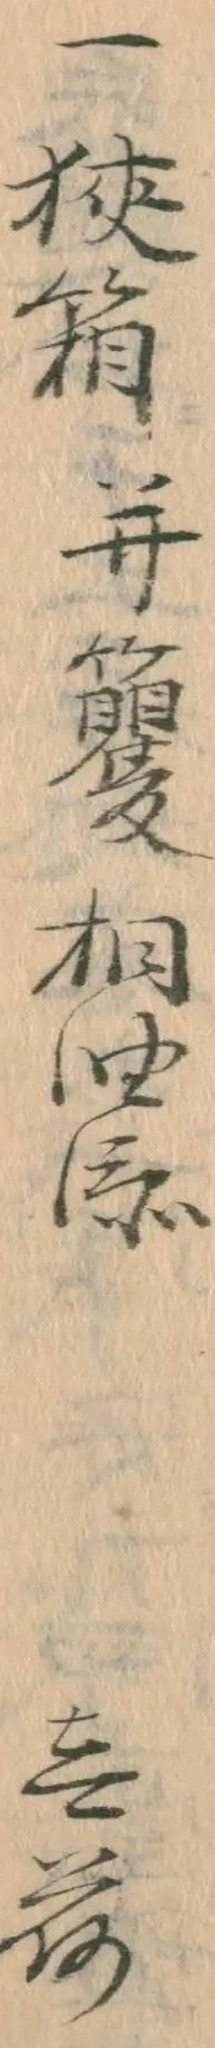一挟箱并籰相油添壱箱
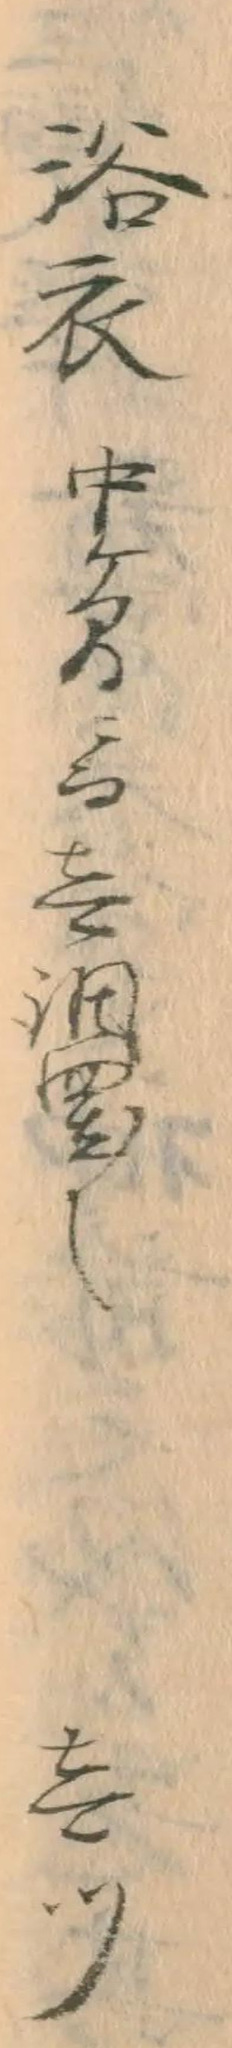一浴衣中ケ間ニ而壱調置也壱ツ
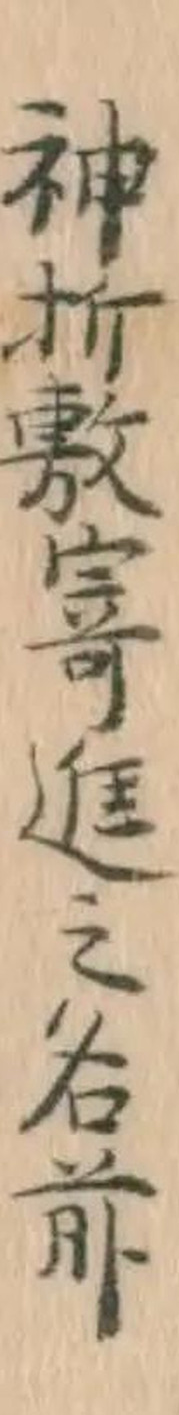神折敷寄進之名前
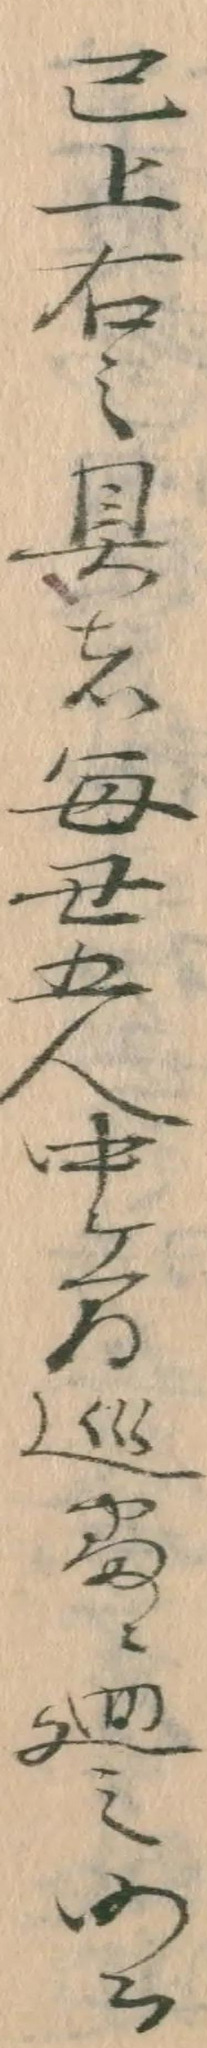已上右之具者毎丑五人中ケ間巡番二廻之仍而
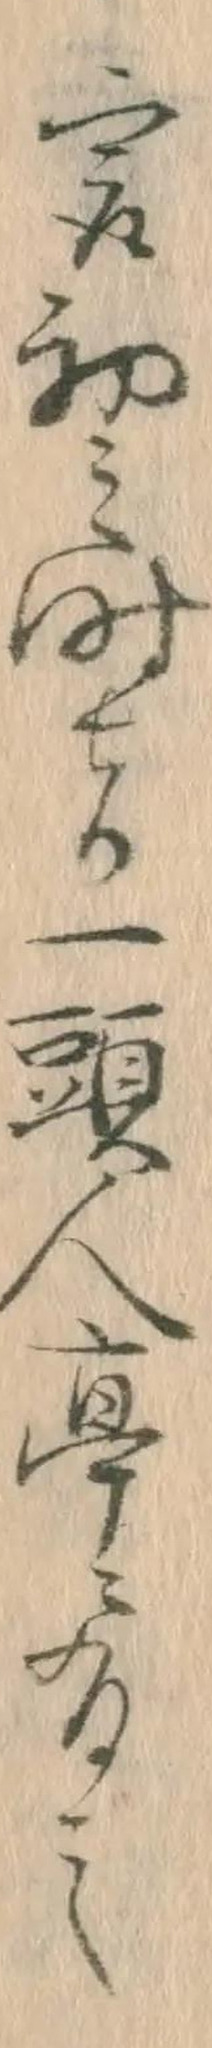最初之時者一頭人亭ニ有之
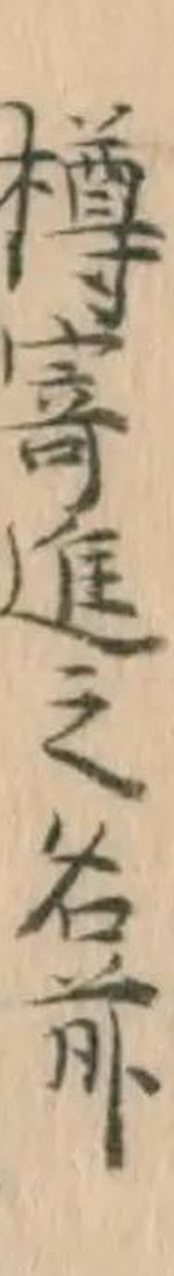樽寄進之名前
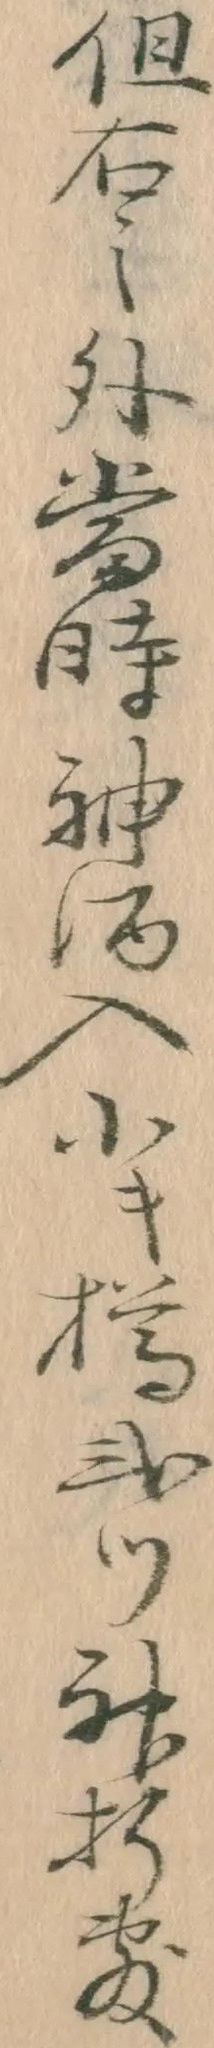但右之外當時神酒入小キ樽弐ツ神折敷
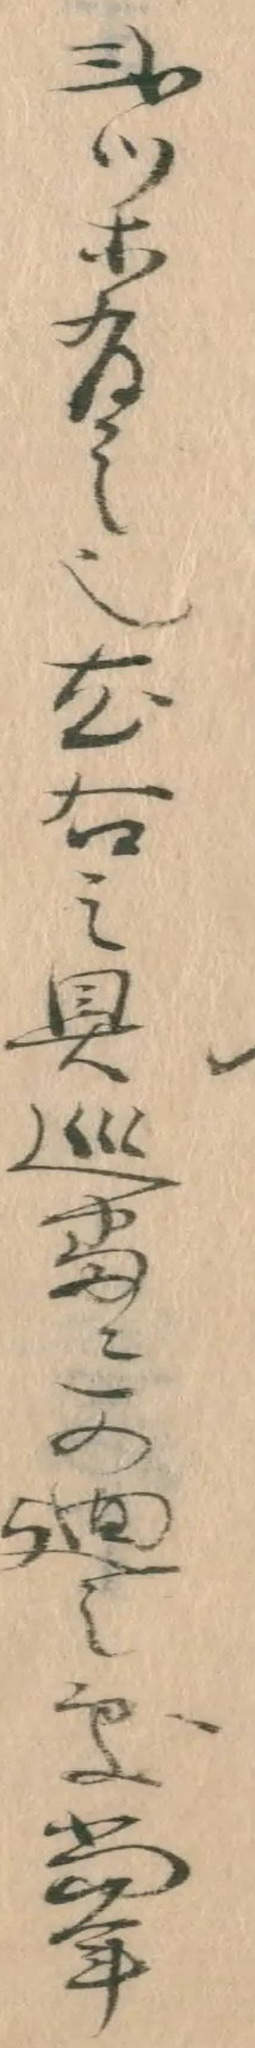弐ツ等有之也尤右之具巡番ニ可廻之處當年
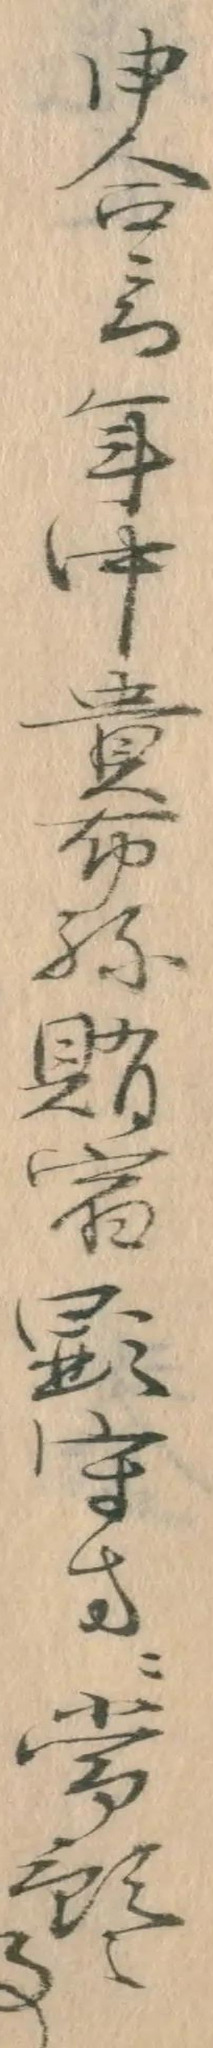申合ニ而年中貴布祢賄宿顕彰守方ニ常預之事
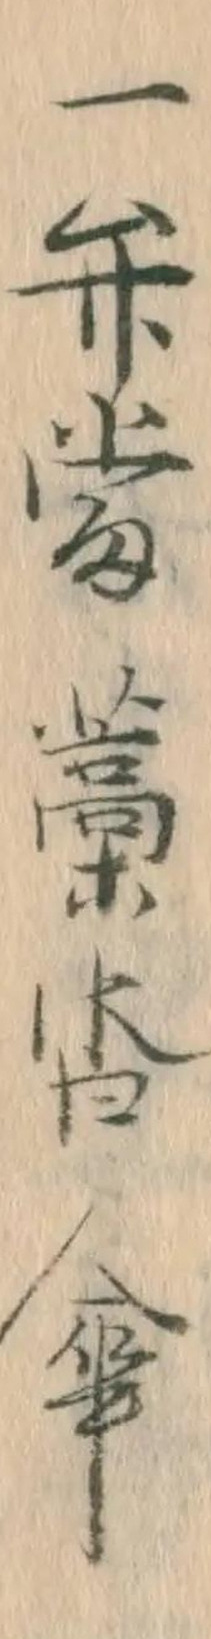一弁當藁沓傘
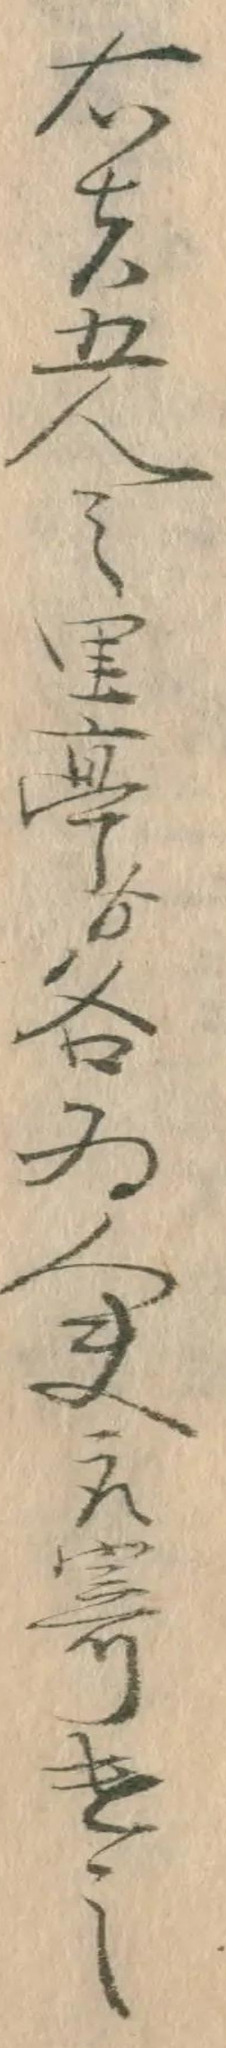右者五人之里亭ゟ各為人夫取寄遣之
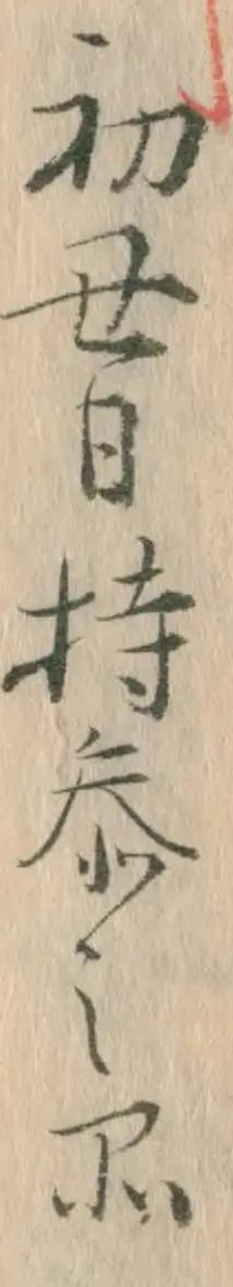初丑日持参之品

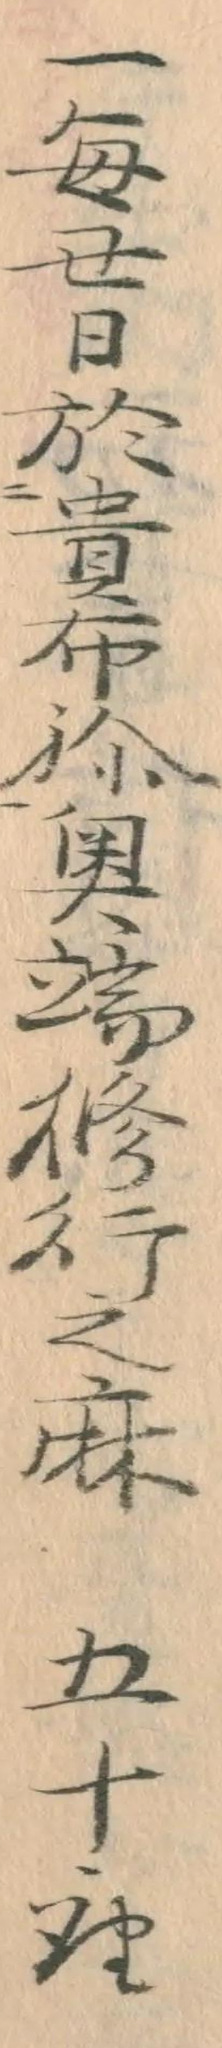一毎丑日於貴布祢奥端修行之麻五十座
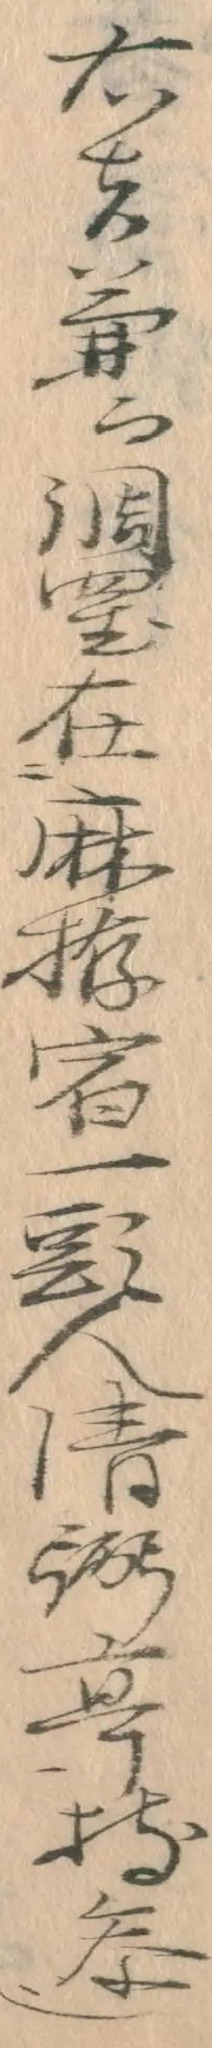右者兼而調置在麻拵宿一頭人清弼亭持参也
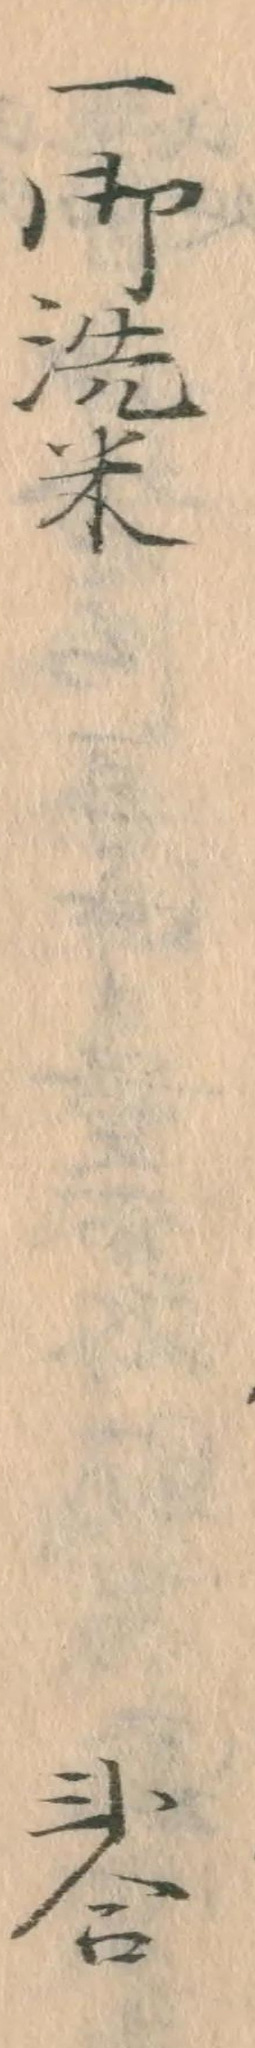一御洗米弐合
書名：賀茂社記録. 第72冊
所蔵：国立国会図書館 National Diet Library, JAPAN
